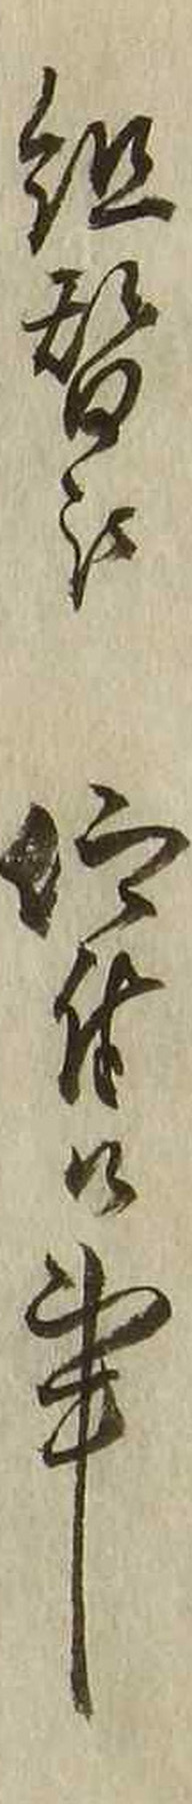組替被仰付候事
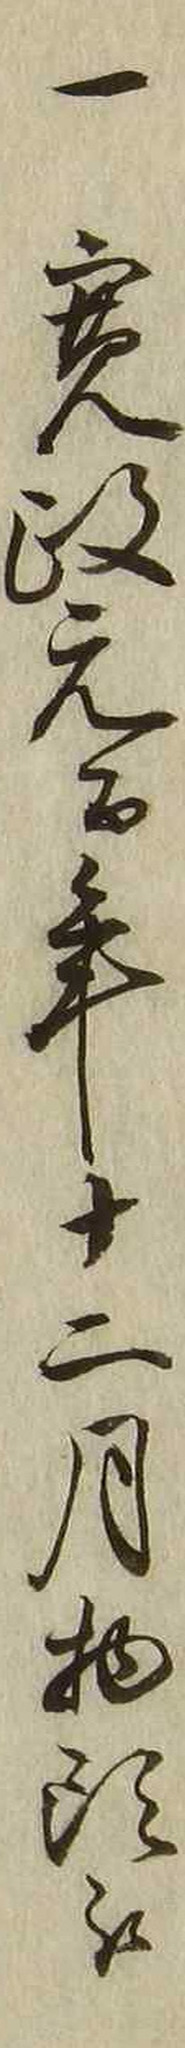一寛政元酉年十二月物頭被
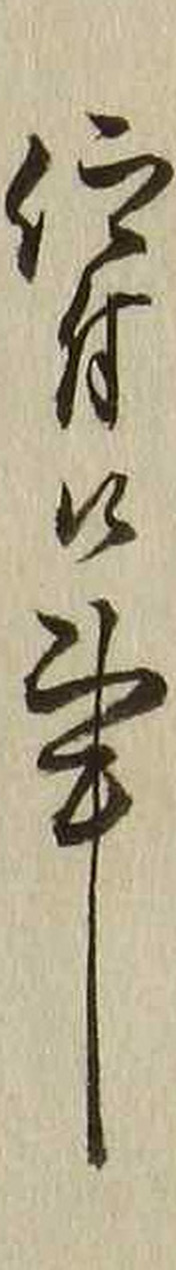仰付候事
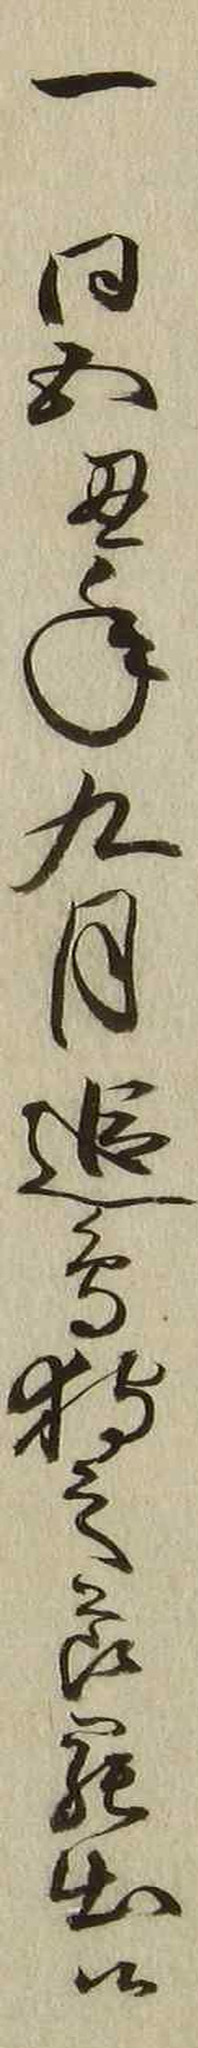一同五丑年九月追鳥狩之節罷出候
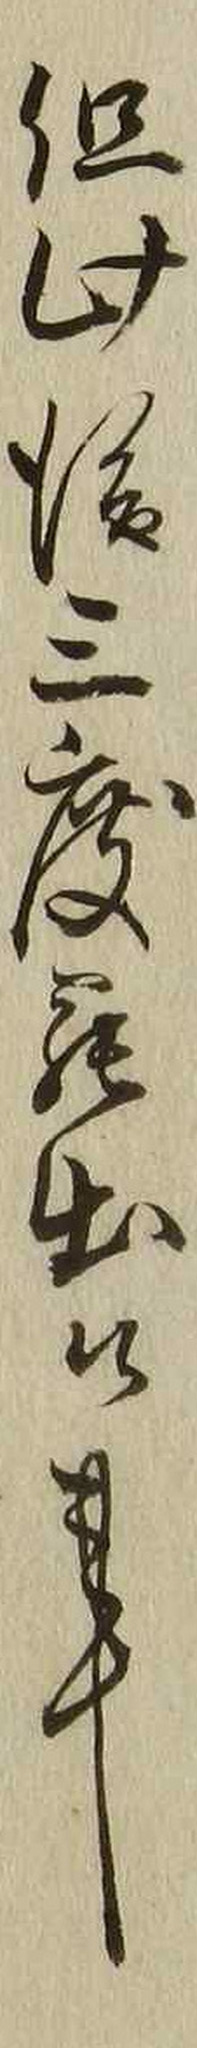但此後三度罷出候事
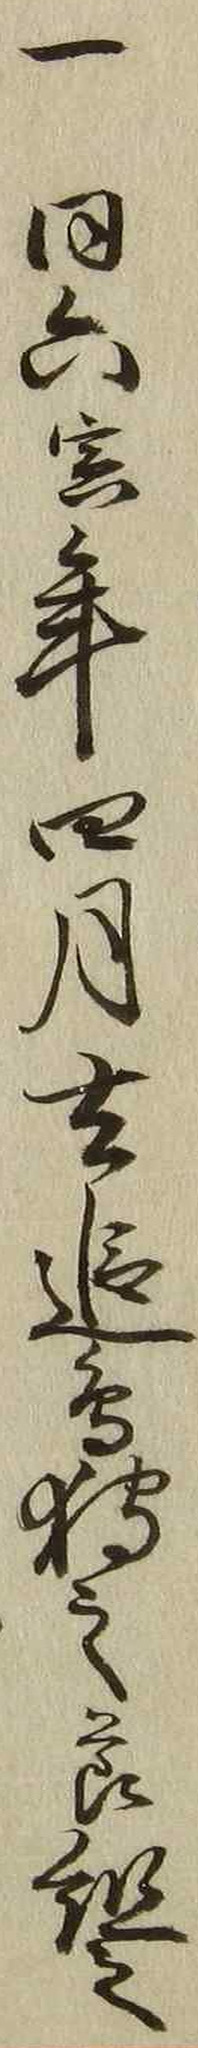一同六寅年四月去追鳥狩之節組之
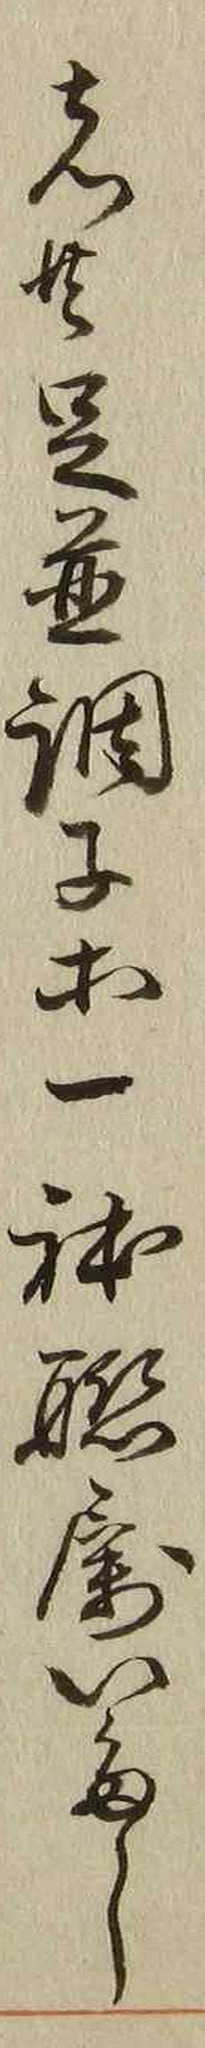者共足並調子等一体聯属いたし
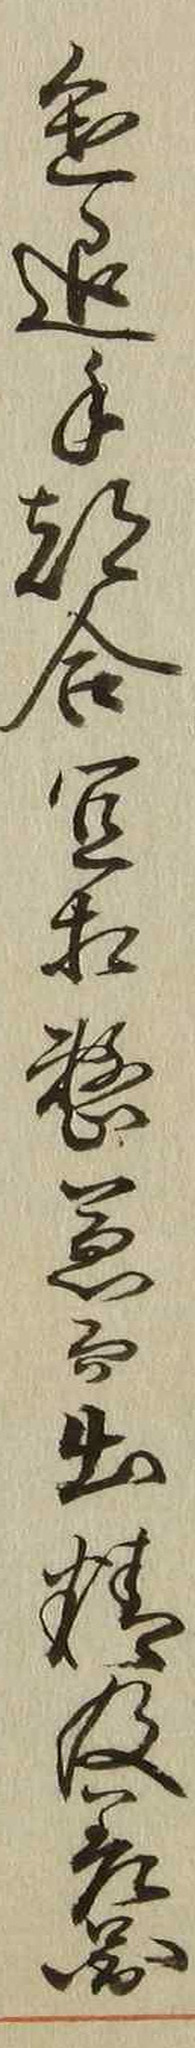進退手都合宜相整兼而出精及差図
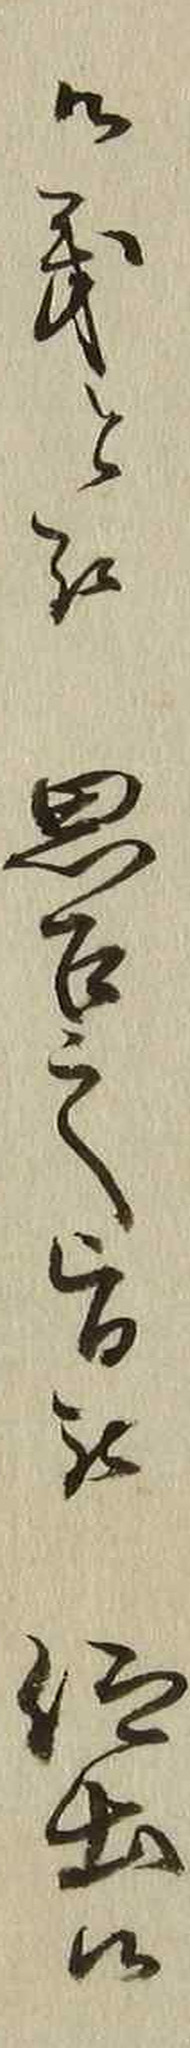候義と被思召之旨被仰出候
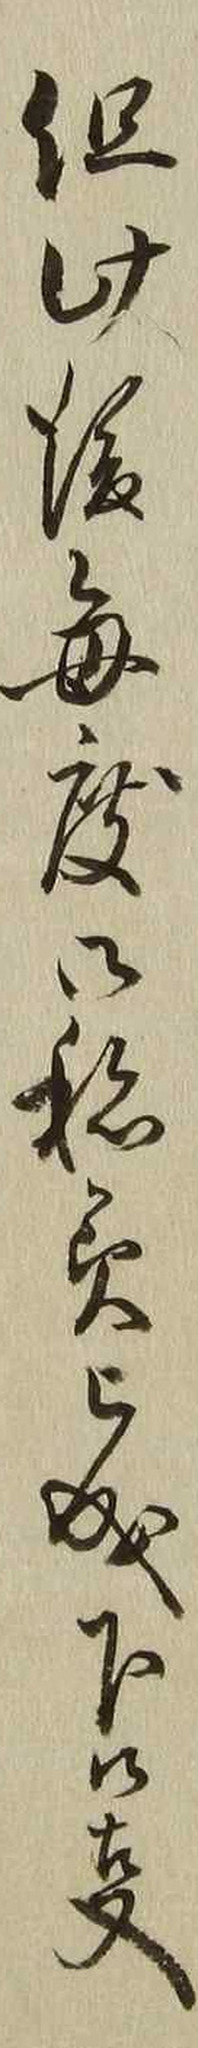但此後毎度御称美被成下候事
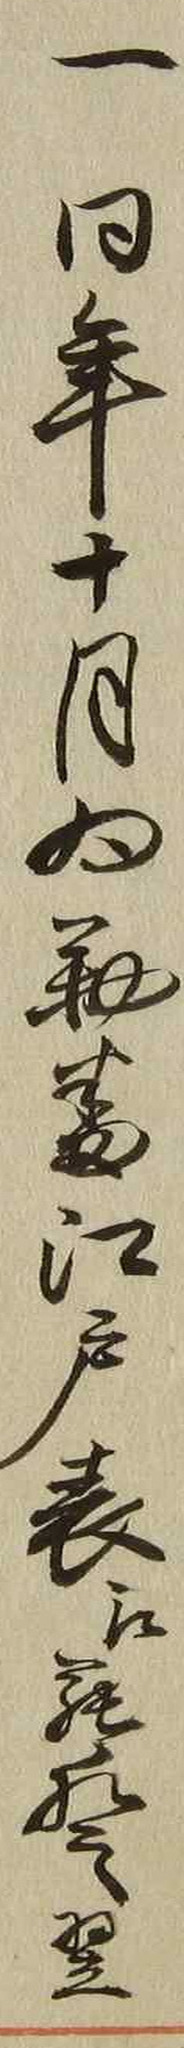一同年十月為勤番江戸表江罷登翌
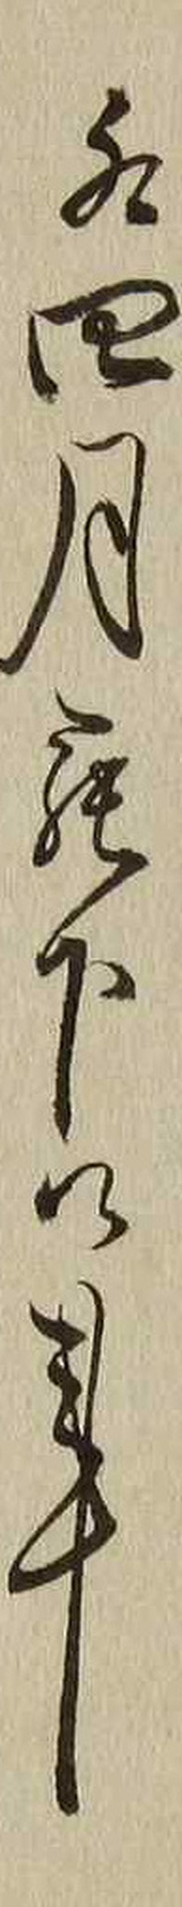卯四月罷下候事
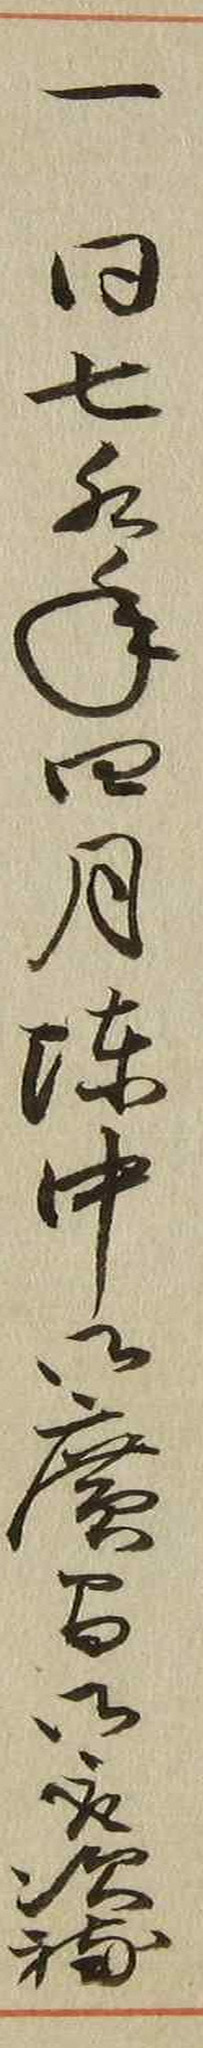一同七卯年四月陣中御広間御取次補
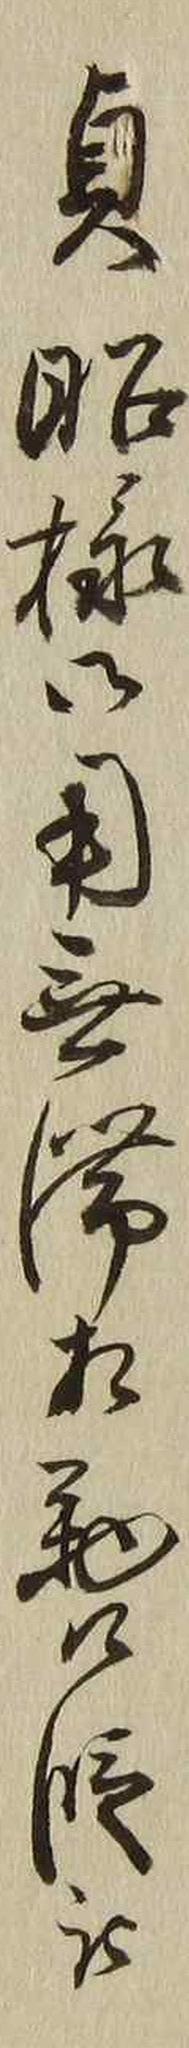貞昭様御用無滞相勤候段被
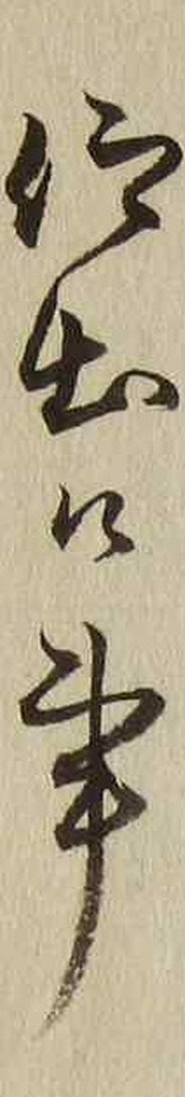仰出候事
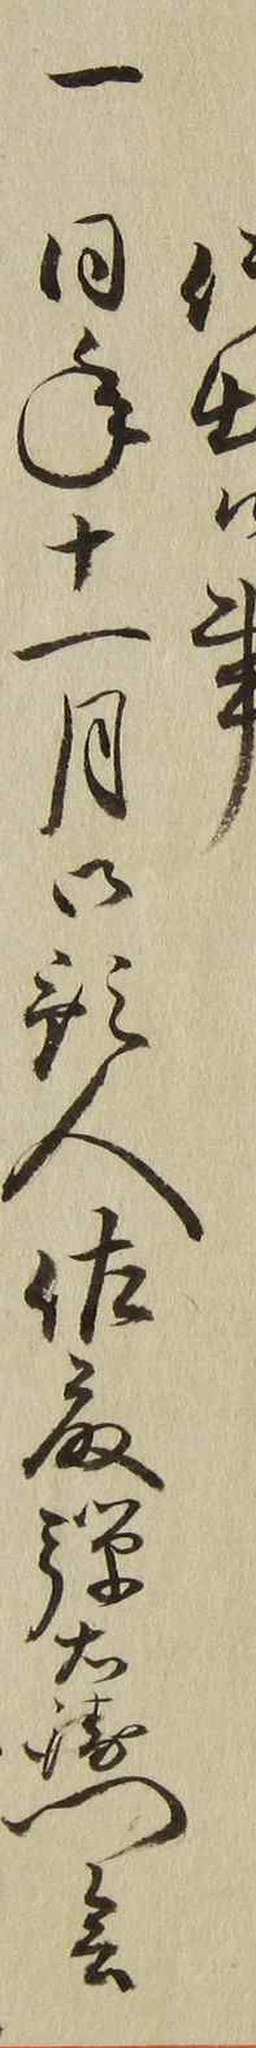一同年十一月御預人佐藤弾右衛門会
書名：諸士系譜　巻之60　と之部3
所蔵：会津若松市立会津図書館
